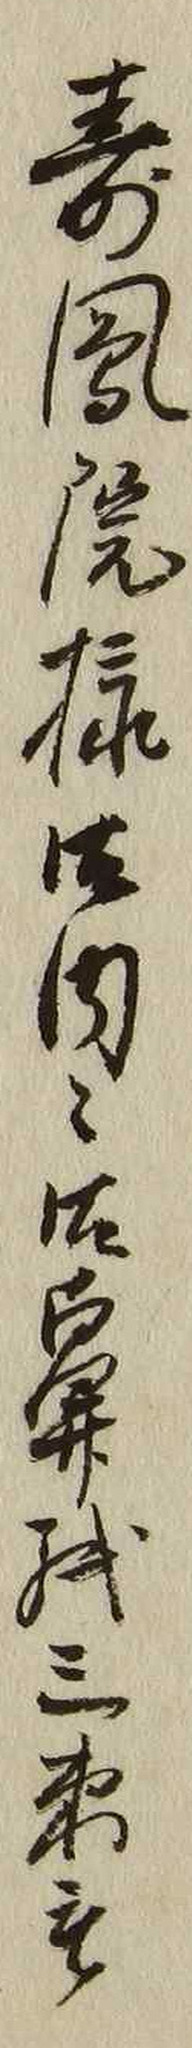寿鳳院様御内々御鼻紙三束被
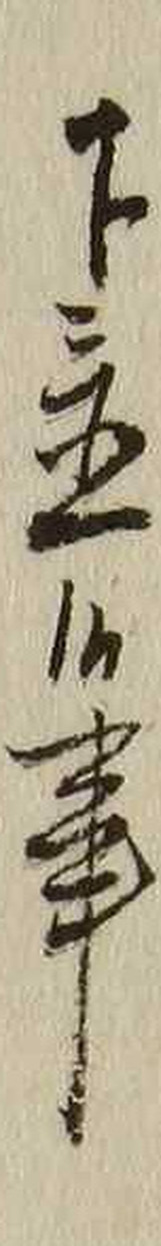下置候事
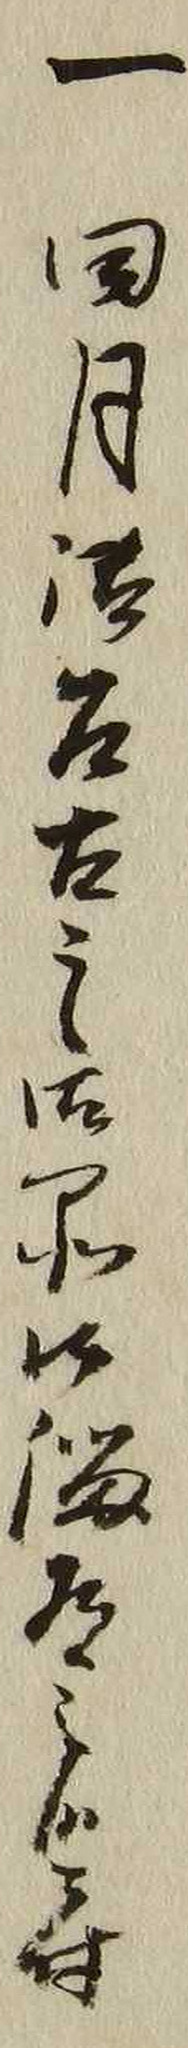一同月御召古之御品御溜有之候ニ付
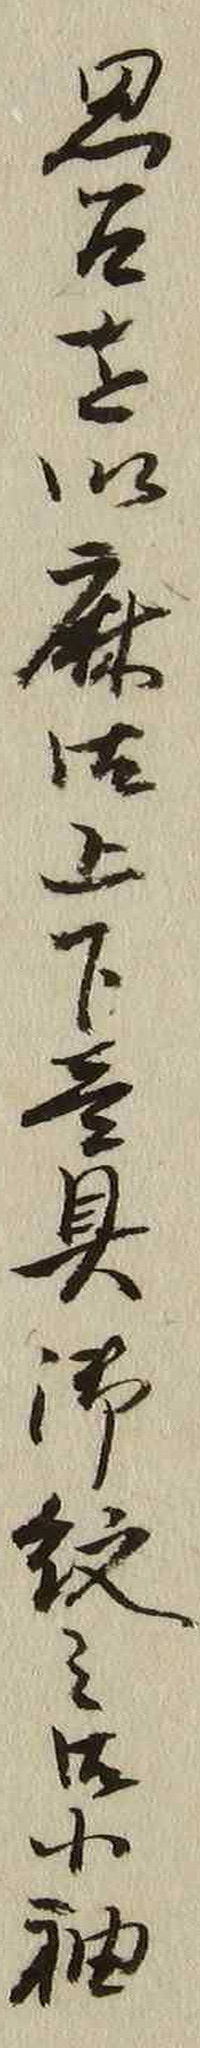思召を以麻御上下壱具御紋之御小袖
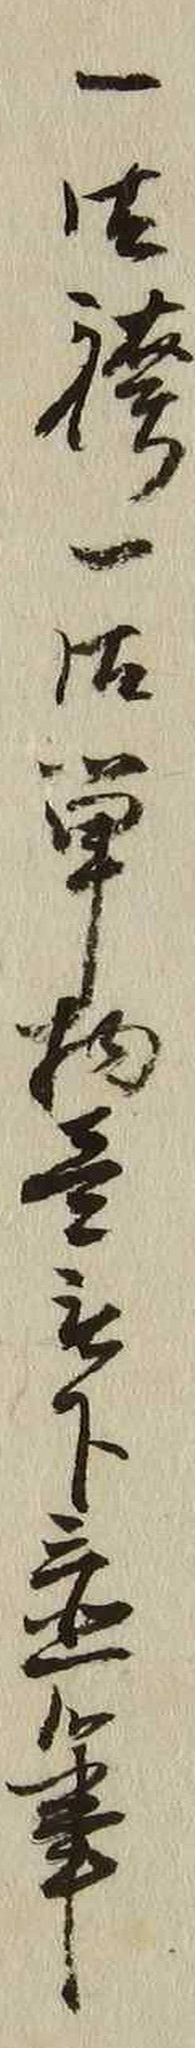一御袴一御単物壱被下置候事
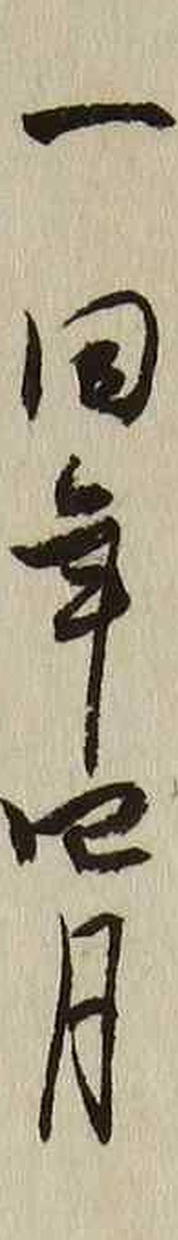一同年四月
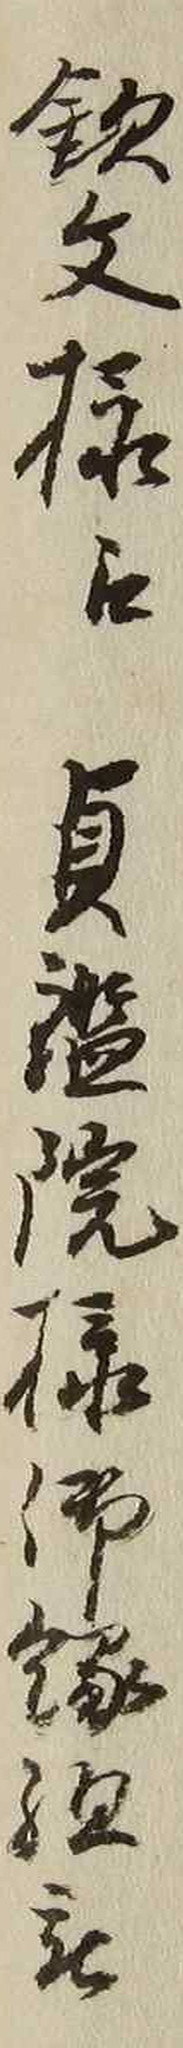欽文様江貞鑑院様御縁組被
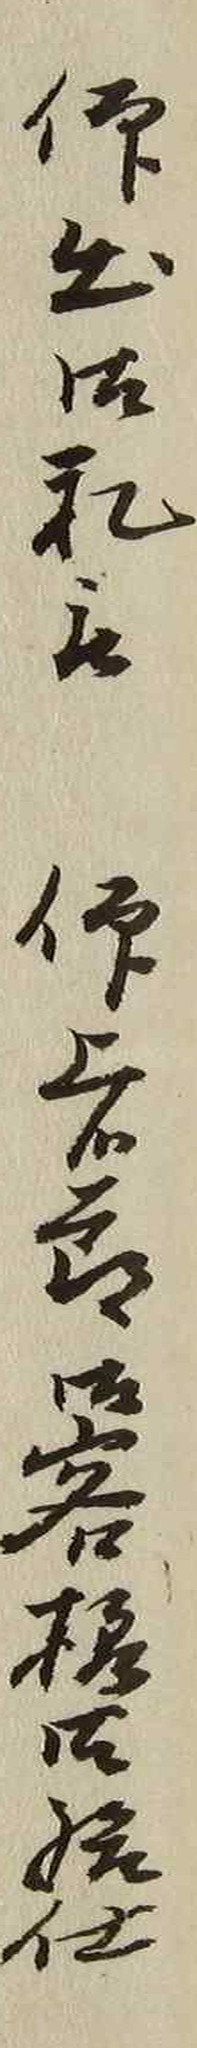仰出御礼被仰上候節御客様御給仕
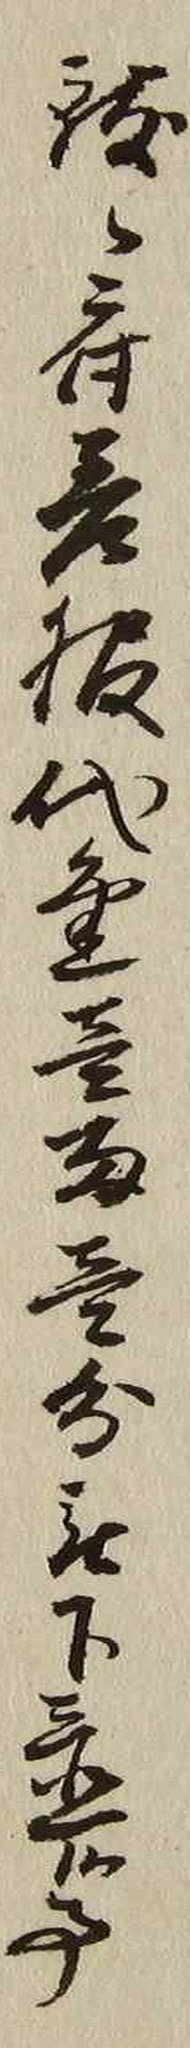致候ニ付着服代金壱両壱分被下置候事
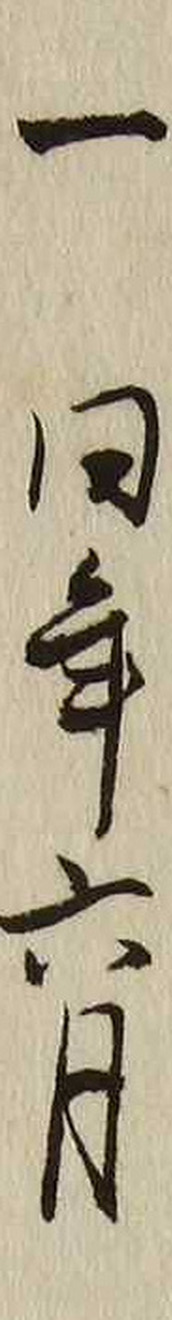一同年六月
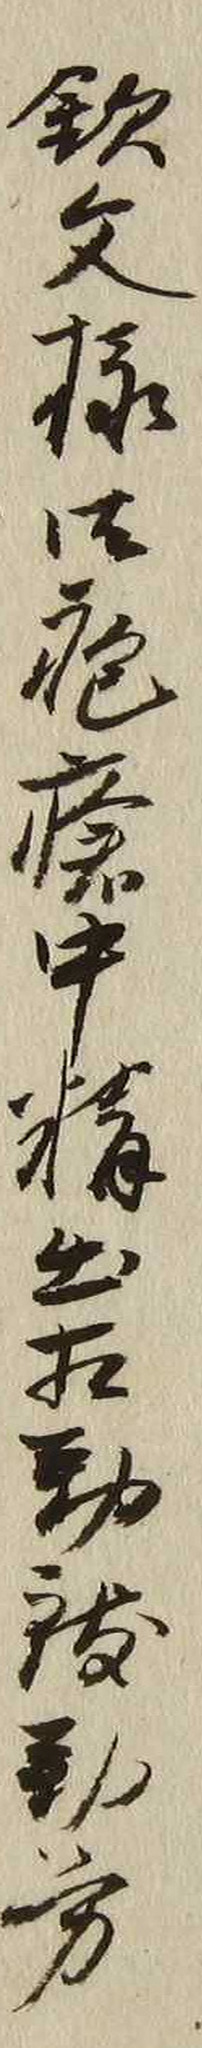欽文様御庖瘡中精出相勤致勤労
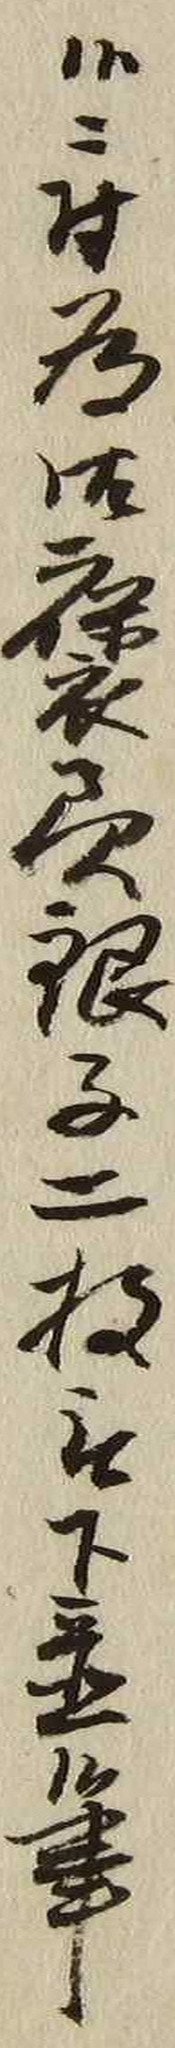候ニ付為御褒美銀子二枚被下置候事
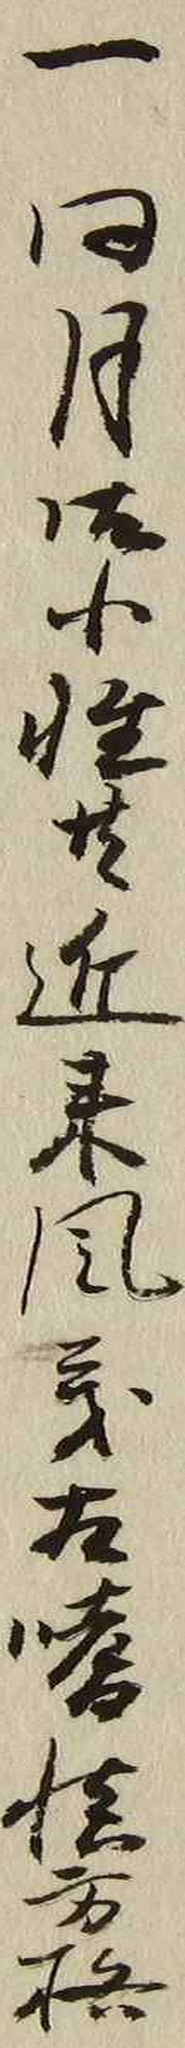一同月御小性共近来風義相嗜慎方格
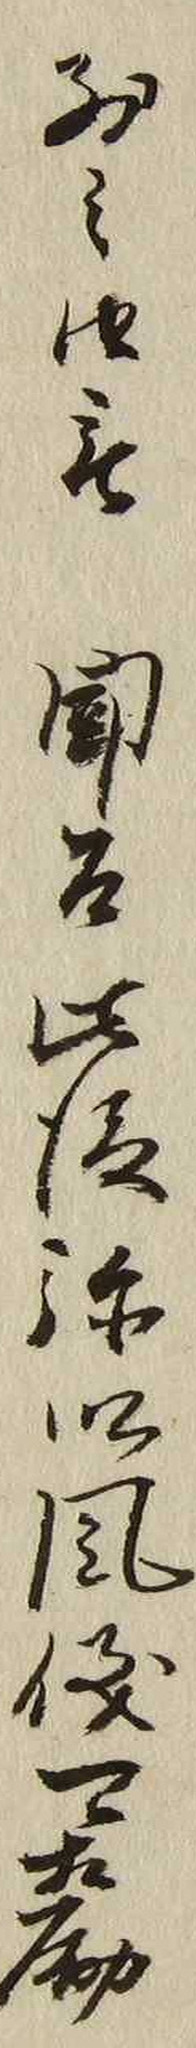別之由被聞召此後弥以風儀可相励
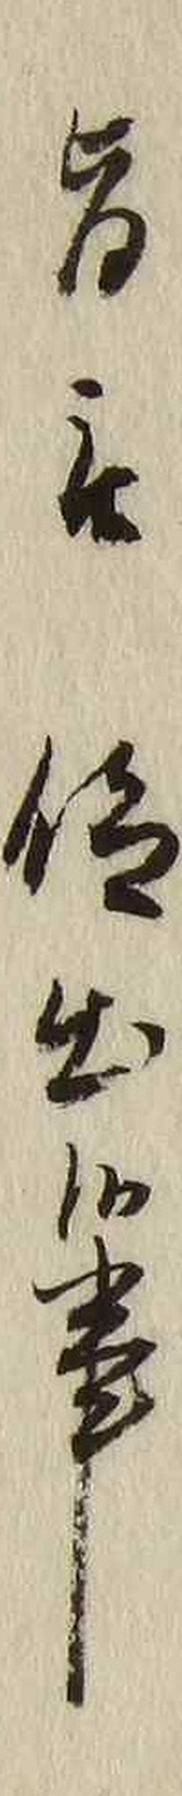旨被仰出候事
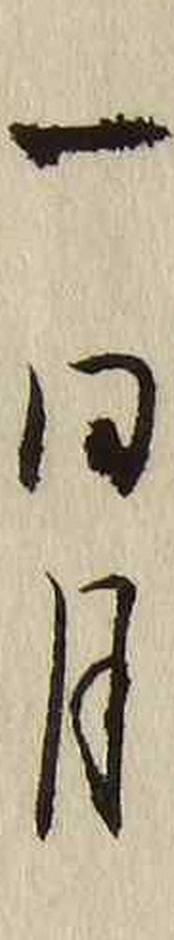一同月
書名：諸士系譜　巻之345　も之部1
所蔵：会津若松市立会津図書館
